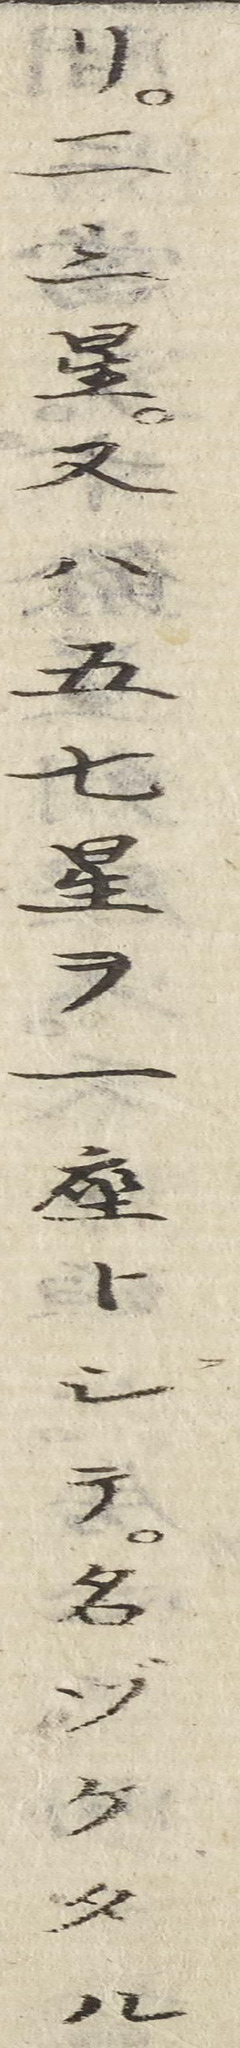リ。二三星。又ハ五七星ヲ一座トシテ。名ヅケタル
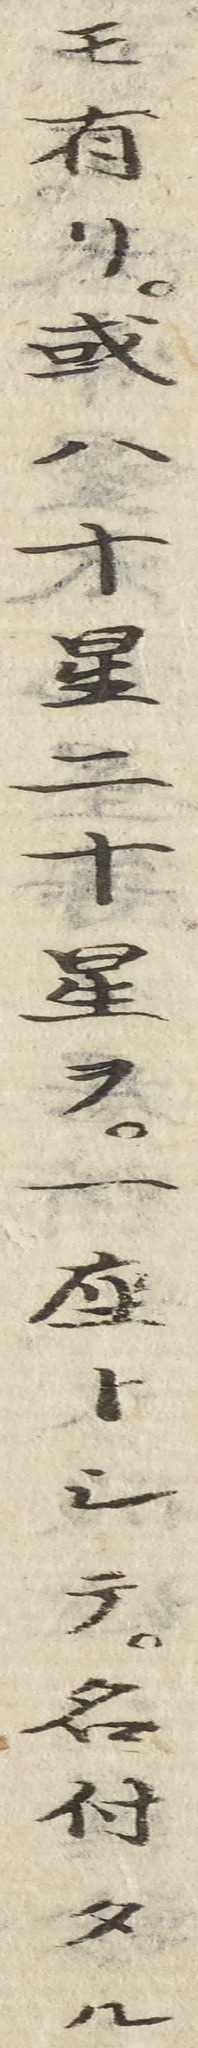モ有リ。或ハ十星二十星ヲ。一座トシテ。名付タル
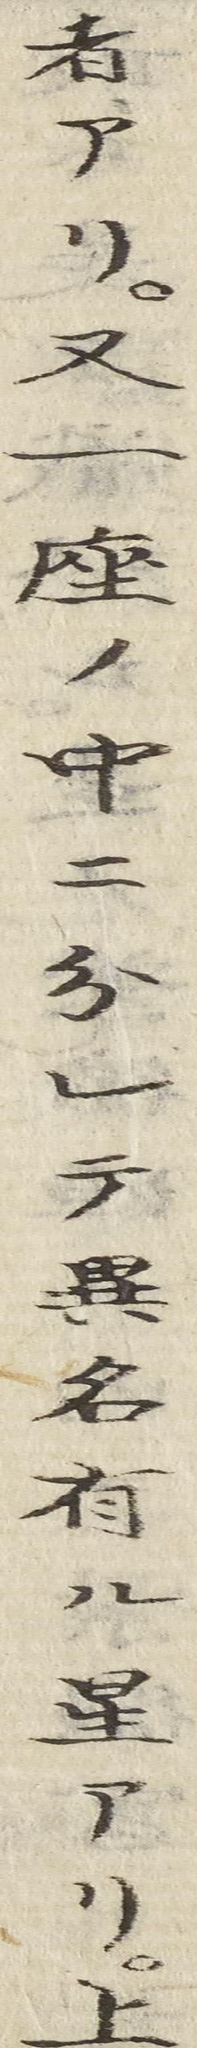者アリ。又一座ノ中ニ分レテ異名有ル星アリ。上
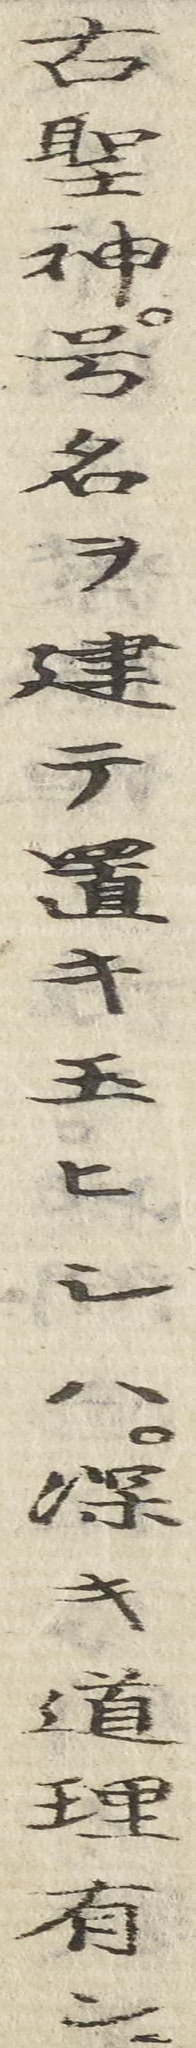古聖神。号名ヲ建テ置キ玉ヒシハ。深キ道理有ン。
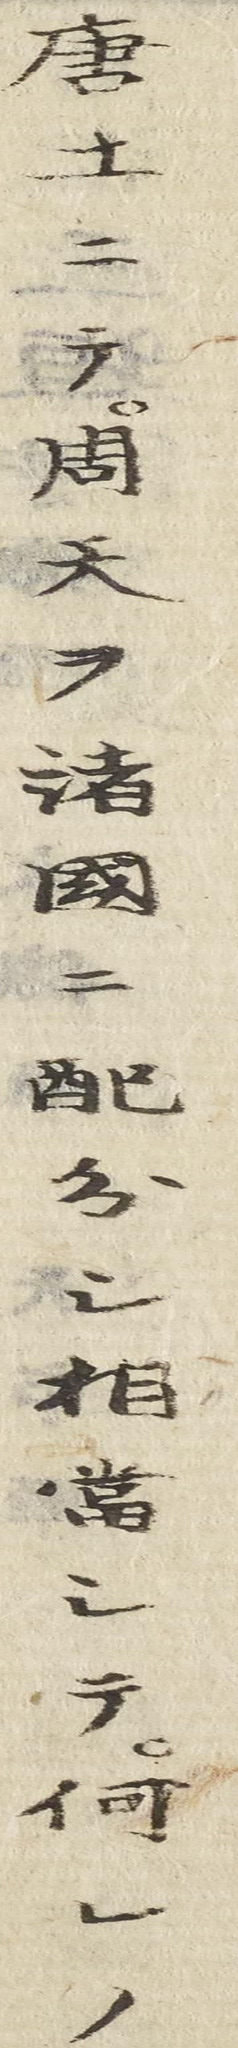唐土ニテ。周天ヲ諸国ニ配分シ相当シテ。何レノ
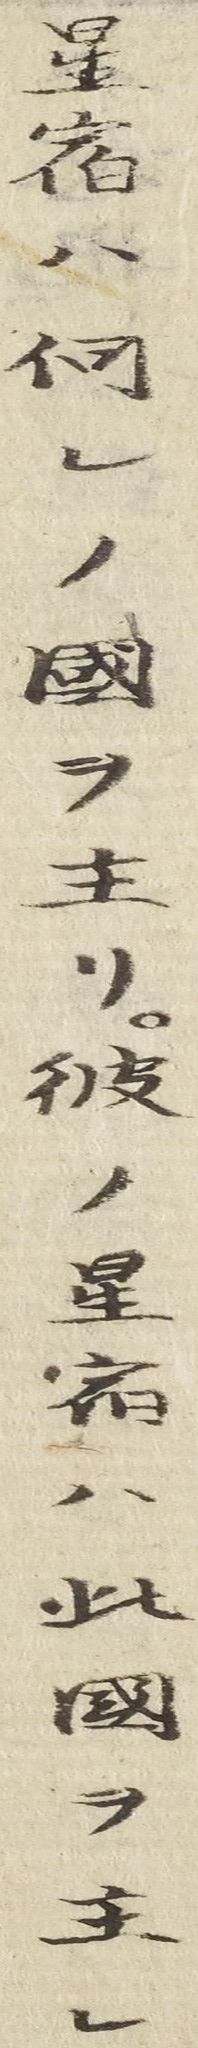星宿ハ何レノ国ヲ主リ。彼ノ星宿ハ此国ヲ主レ
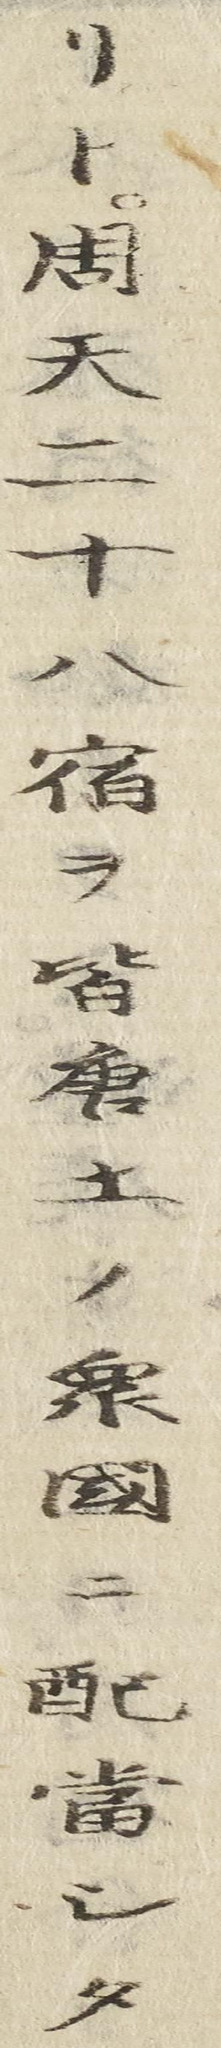リト。周天二十八宿ヲ皆唐土ノ衆国ニ配当シタ
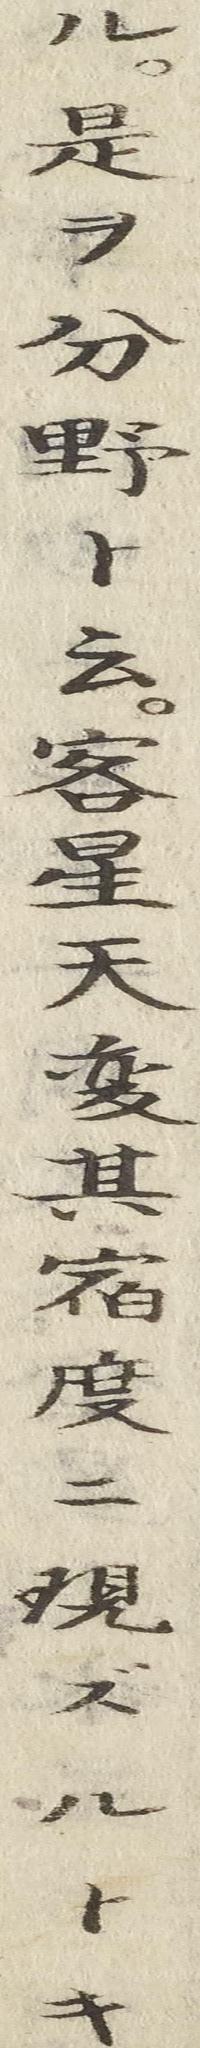ル。是ヲ分野ト云。客星天変其宿度ニ現ズルトキ
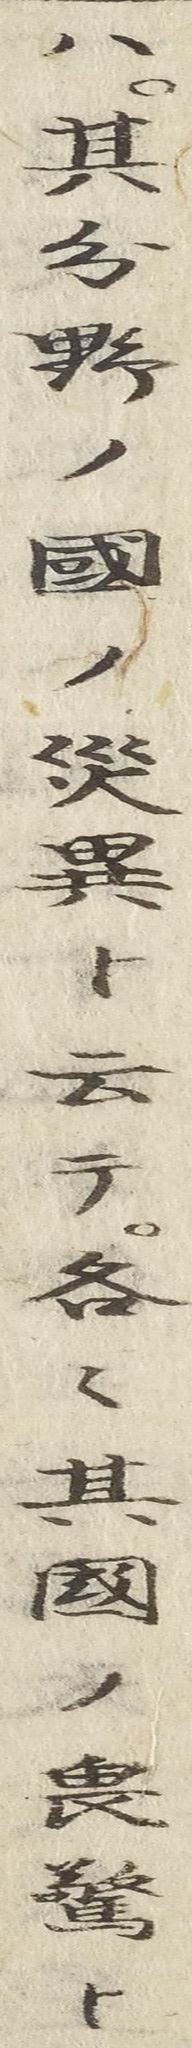ハ。其分野ノ国ノ災異ト云テ。各々其国ノ畏驚ト
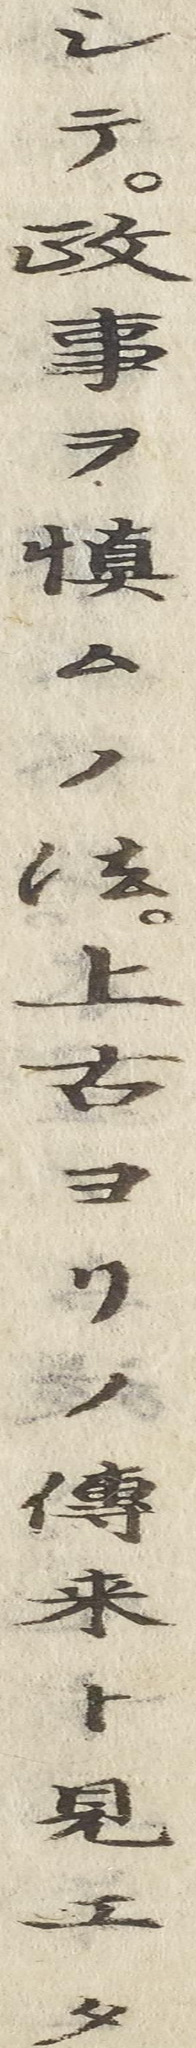シテ。政事ヲ慎ムノ法。上古ヨリノ伝来ト見エタ
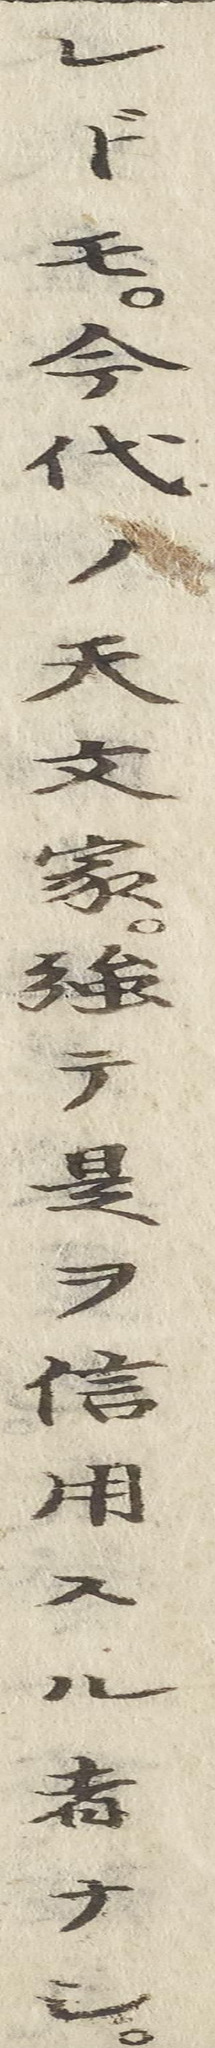レドモ。今代ノ天文家。強テ是ヲ信用スル者ナシ。
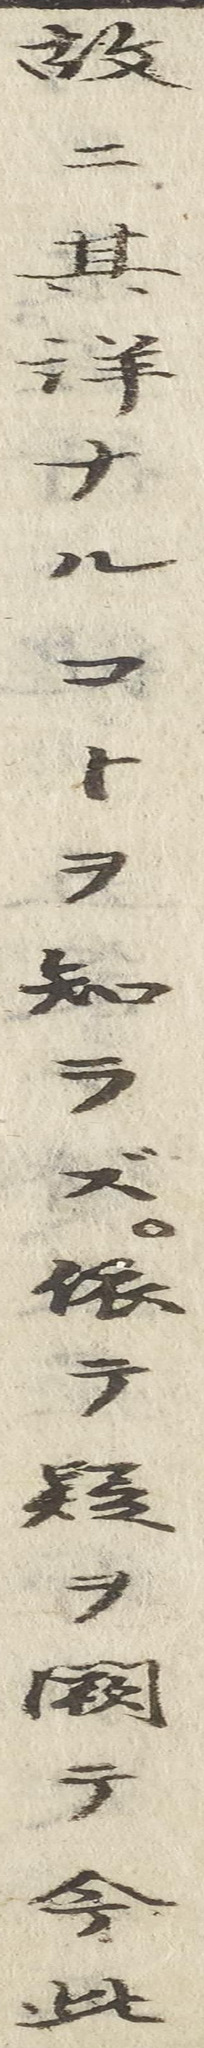故ニ其詳ナルコトヲ知ラズ。依テ疑ヲ闕テ今此
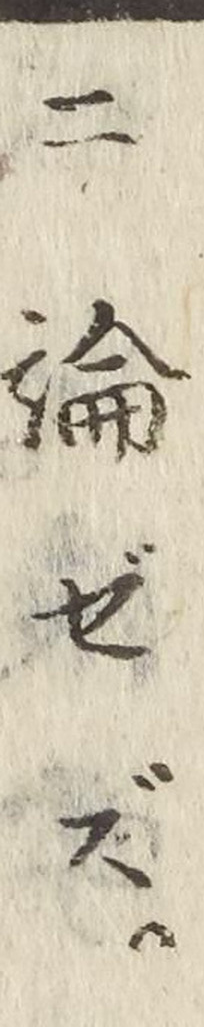ニ論ゼズ。
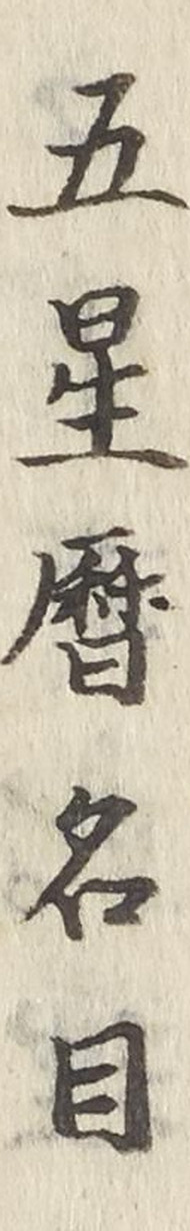五星暦名目
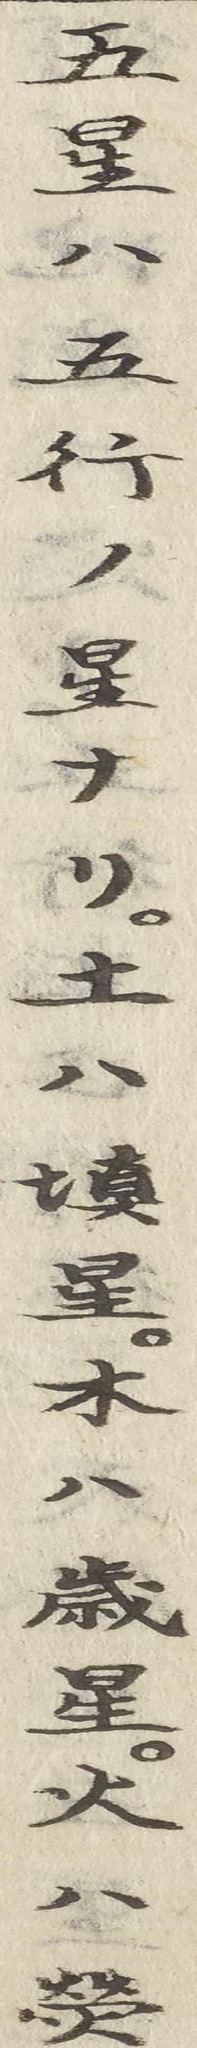五星ハ五行ノ星ナリ。土ハ填星。木ハ歳星。火ハ熒
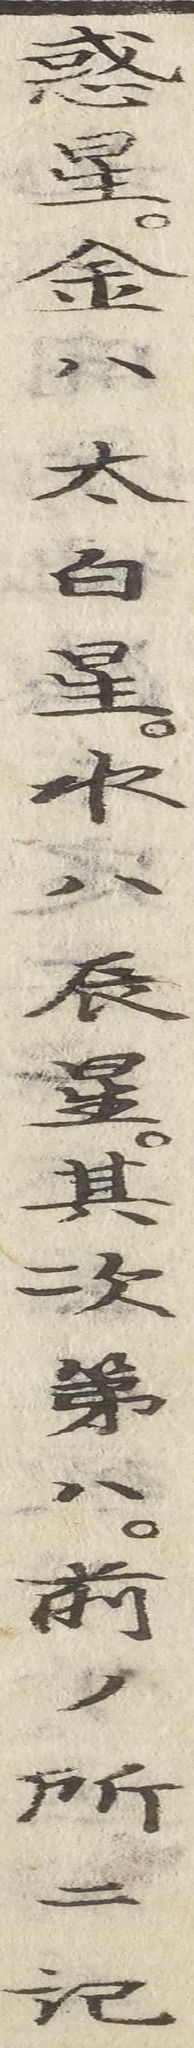惑星。金ハ太白星。水ハ辰星。其次第ハ。前ノ所ニ記
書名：大略天学名目鈔　天經或問附録
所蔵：東京大学地震研究所図書室 Earthquake Research Institute Library, The University of Tokyo, JAPAN
